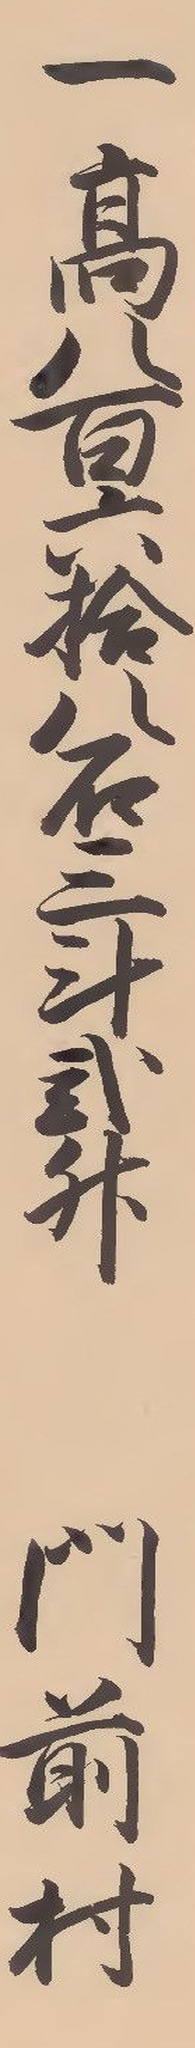一髙八百六拾八石三斗弐升門前村
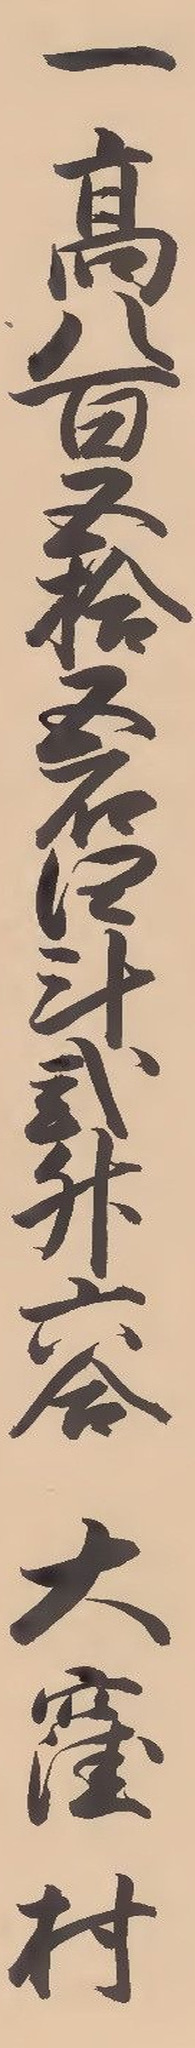一髙八百五拾五石四斗弐升六合大窪村
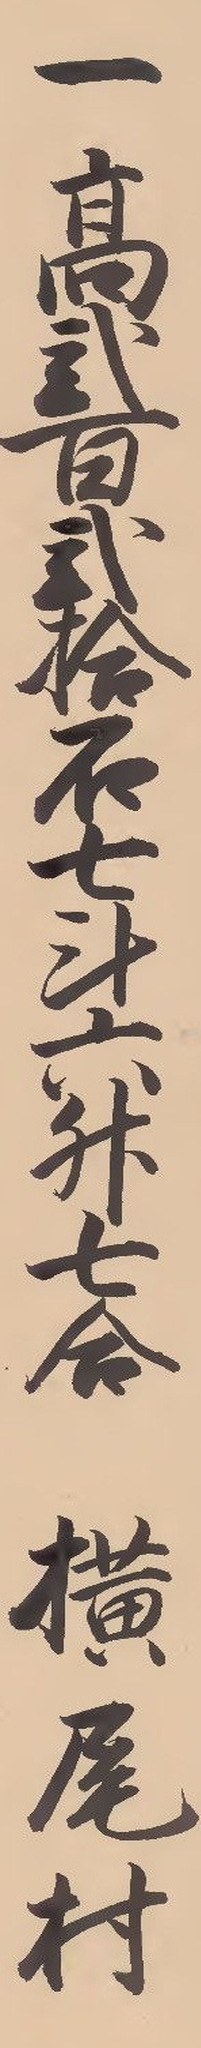一髙弐百弐拾石七斗六升七合横尾村
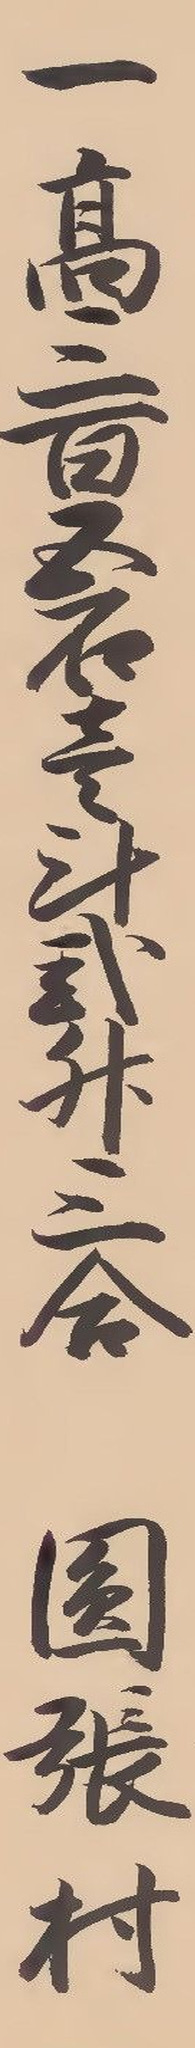一髙三百五石壱斗弐升三合圓張村
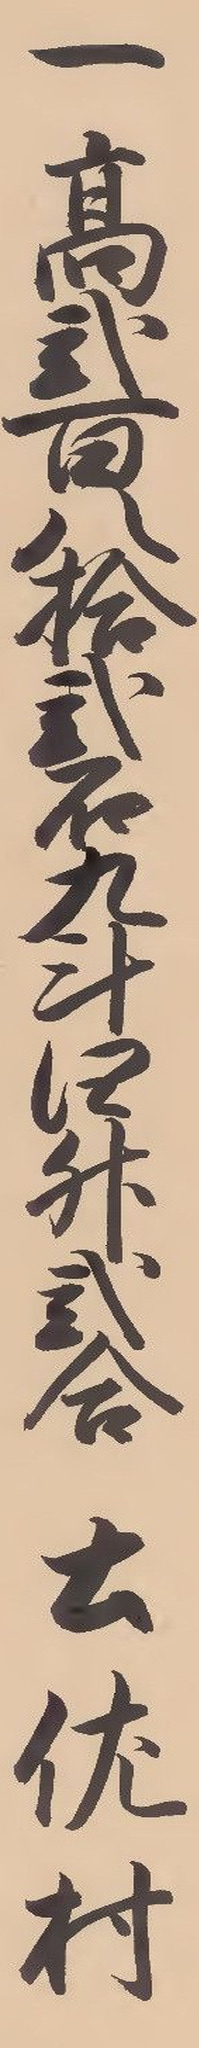一髙弐百八拾弐石九斗四升弐合土佐村
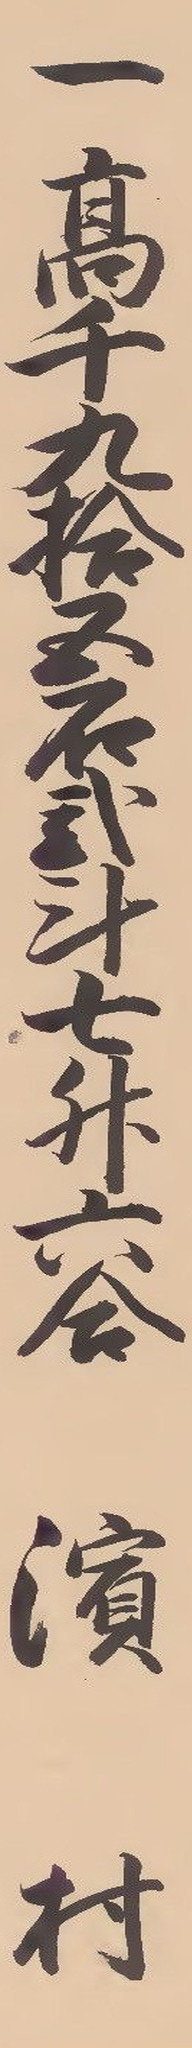一髙千九拾五石弐斗七升六合濱村

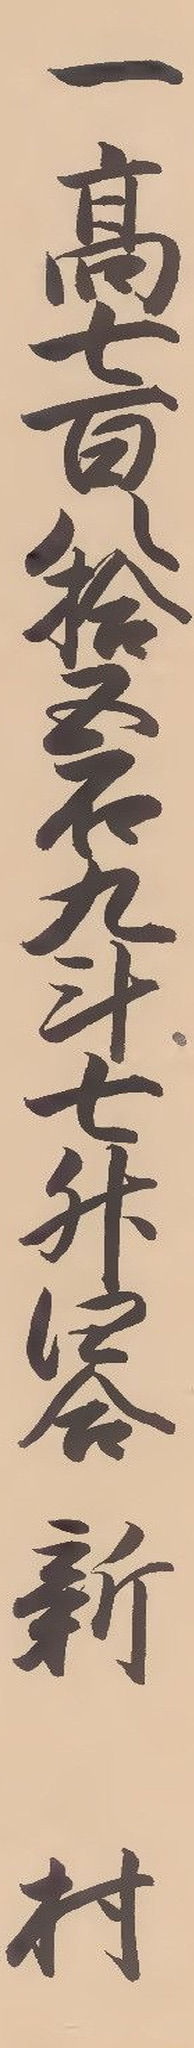一髙七百八拾五石九斗七升四合新村
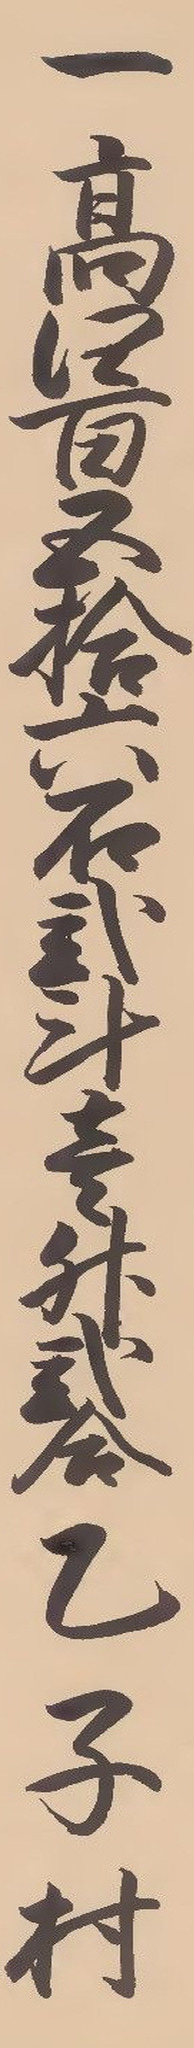一髙四百五拾六石弐斗壱升弐合乙子村
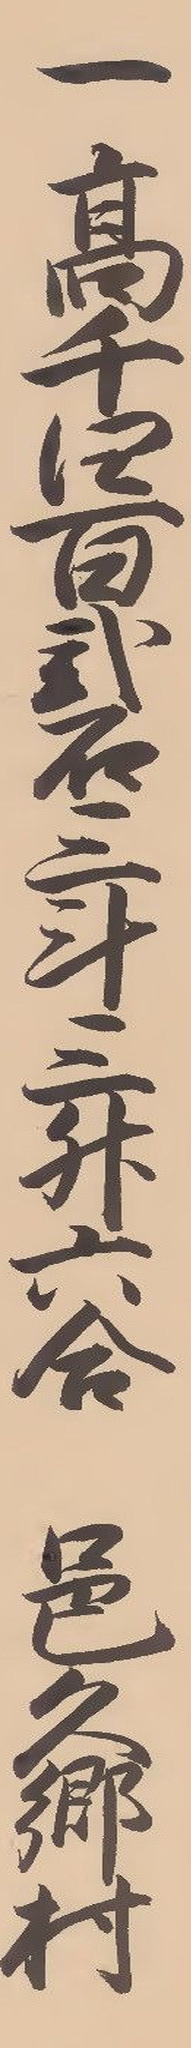一髙千四百弐石三斗三升六合邑久郷村
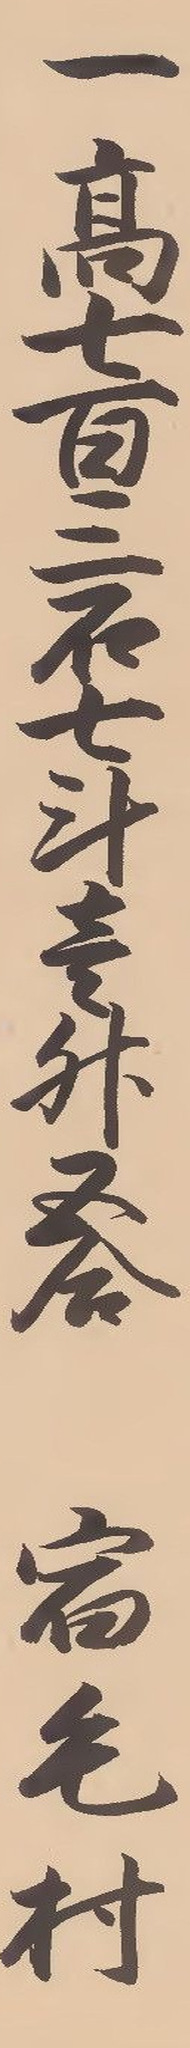一髙七百三石七斗壱升五合宿毛村
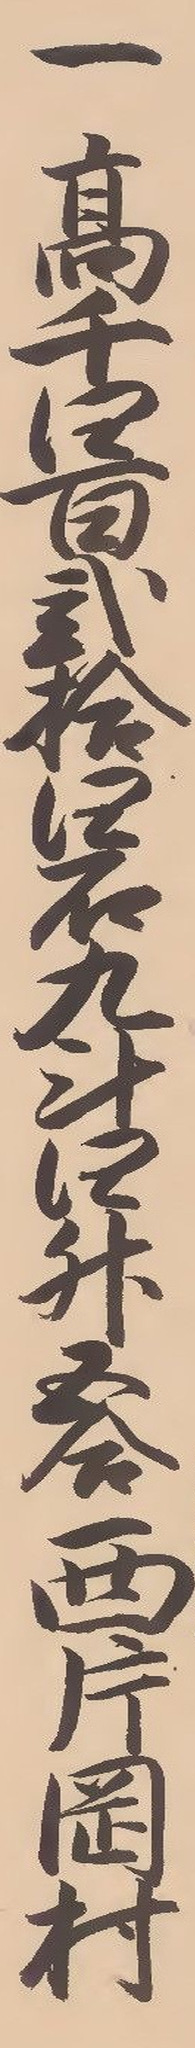一髙千四百弐拾四石九斗四升五合西片岡村
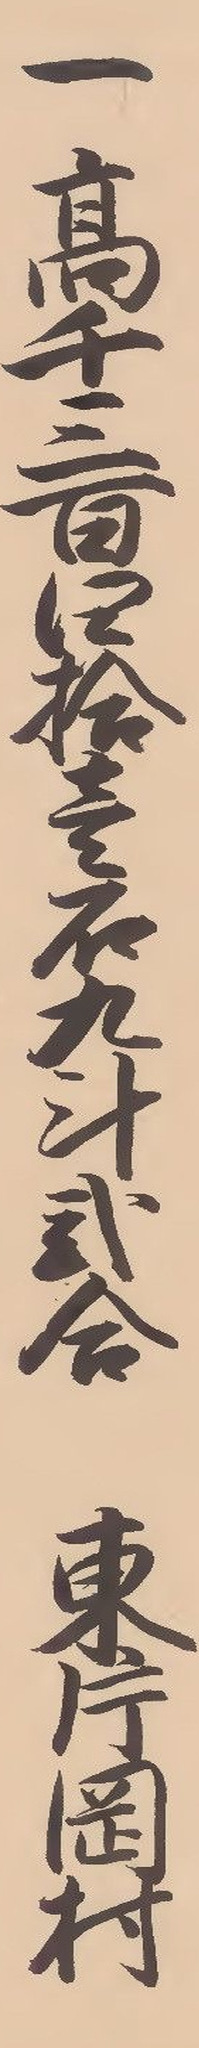一髙千三百四拾壱石九斗弐合東片岡村
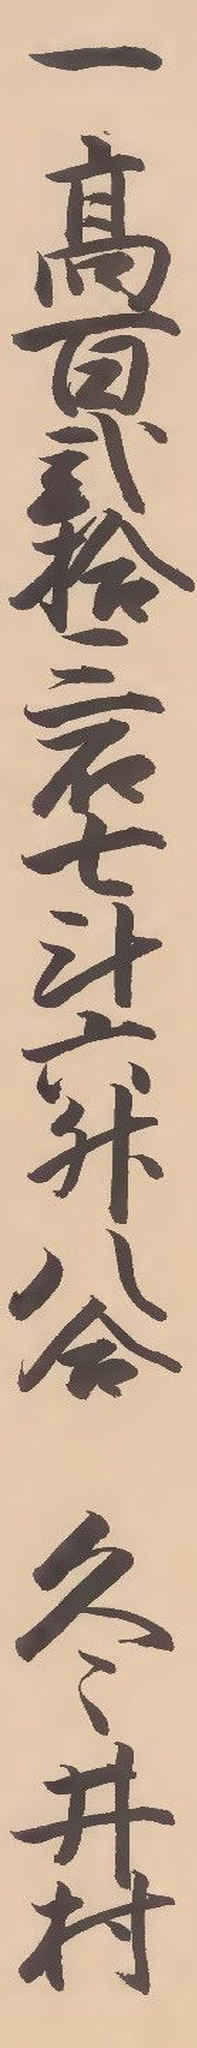一髙百弐拾三石七斗六升八合久々井村
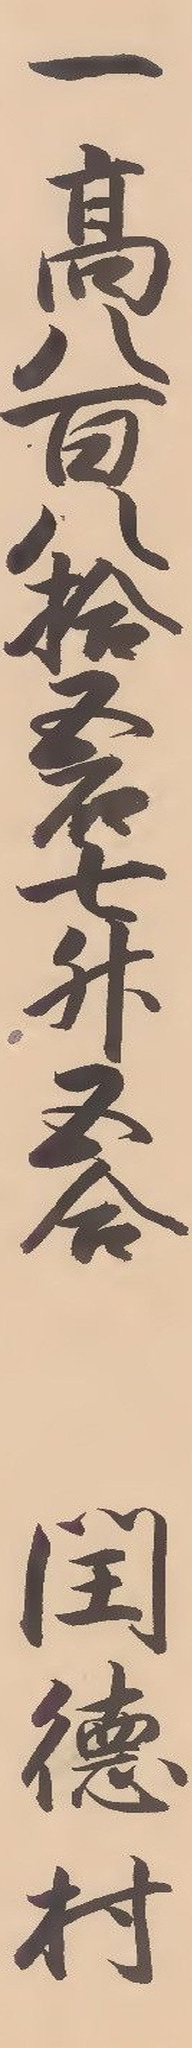一髙八百八拾五石七升五合閏徳村

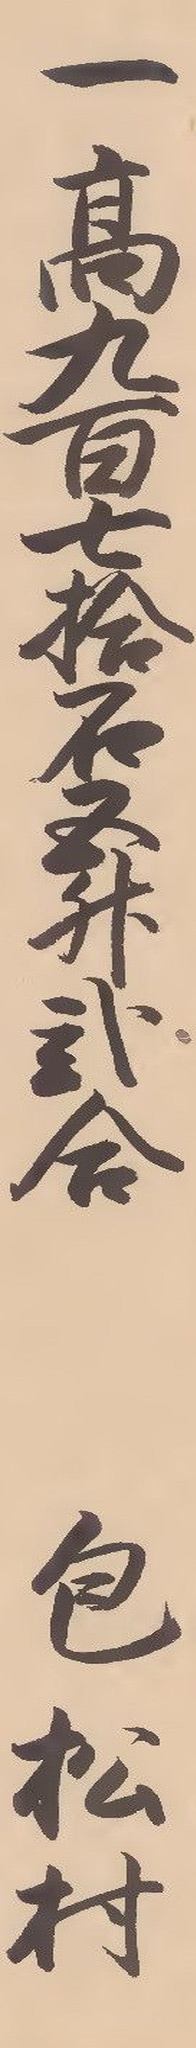一髙九百七拾石五升弐合包松村
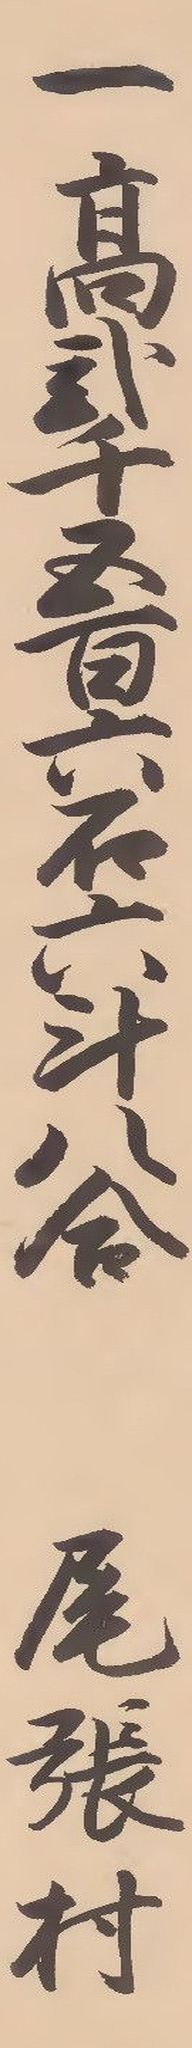一髙弐千五百六石六斗八合尾張村
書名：備前国郷帳
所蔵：国立公文書館 National Archives of Japan
